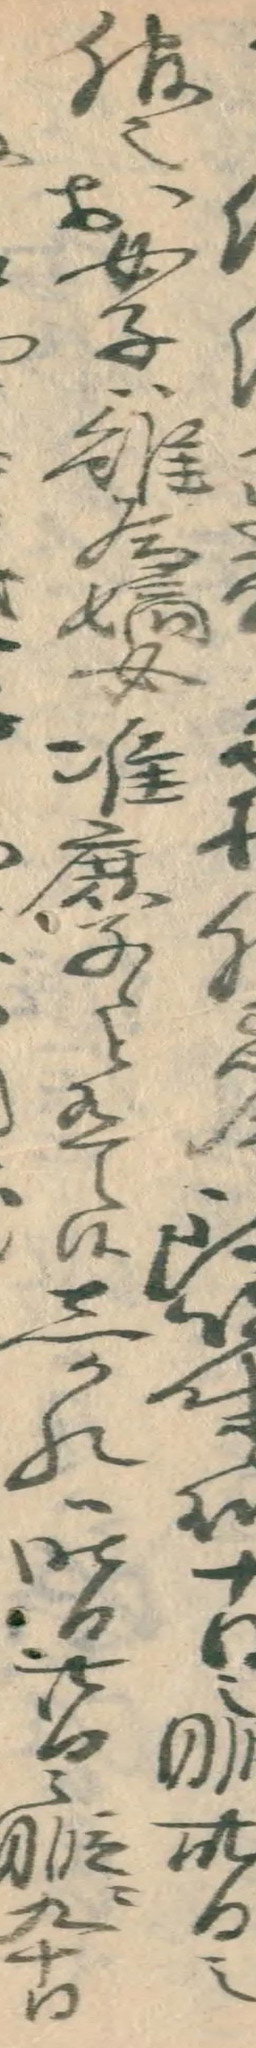服也於女子ハ雖為嫡女准庶子候と有之候しかれハ昨日廿日之暇ニ九十日
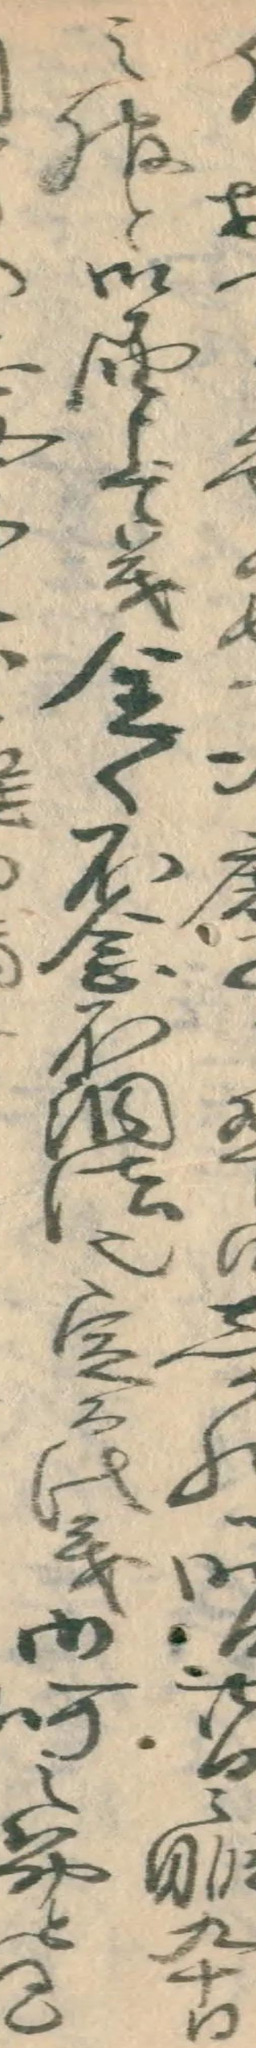之服と御届申上候義全く不念不調法也定而此義御呵之筋と存候
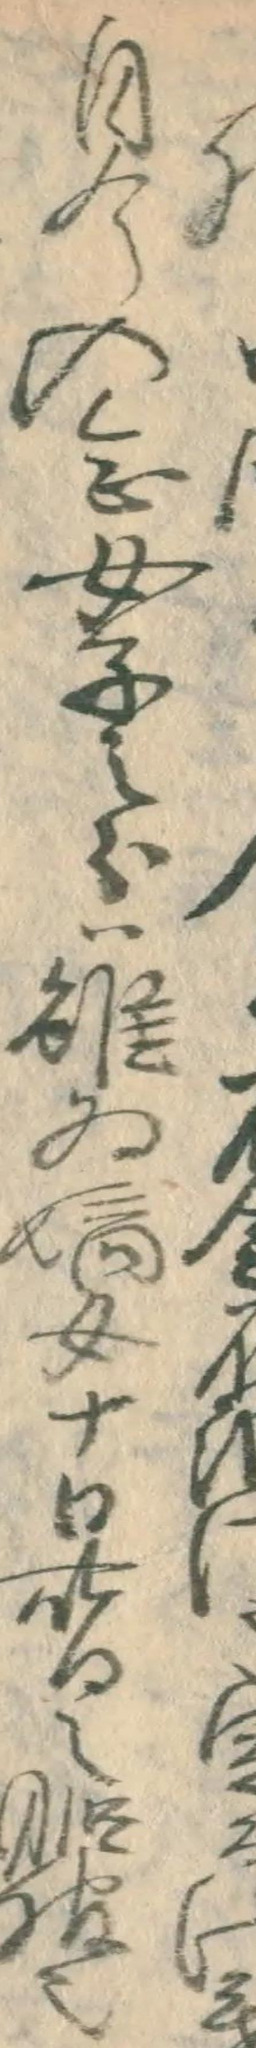自今入念女子之分ハ雖為嫡女十日卅日之暇服也
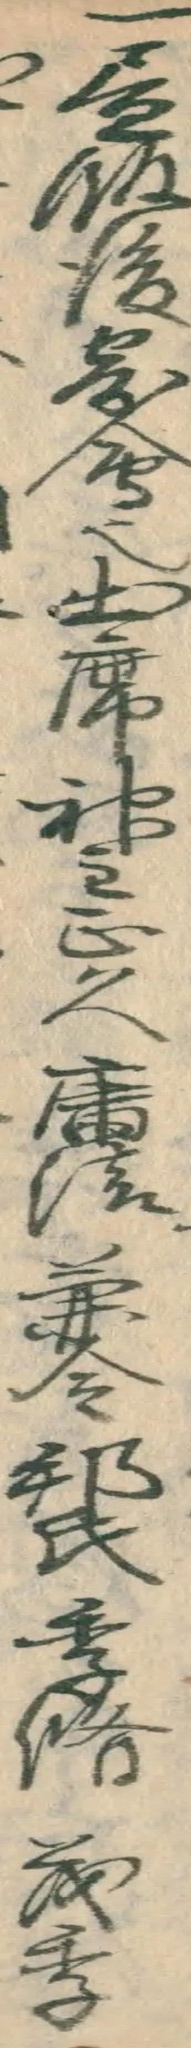一昼飯後寄会也出席神主正久庸清兼令邦氏季脩茂季
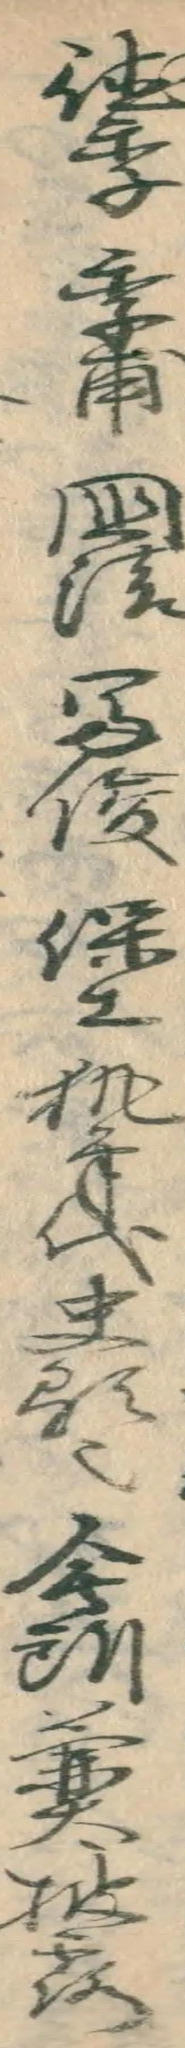徳季季甫国清富俊保土執筆代史顕也会所兼太披露
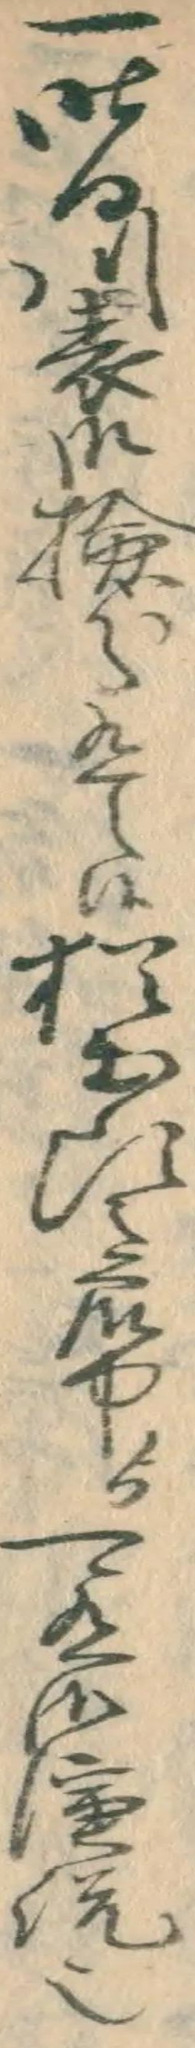一昨日川表御検分有之候猶出頭之衆中ゟ可有御演説也

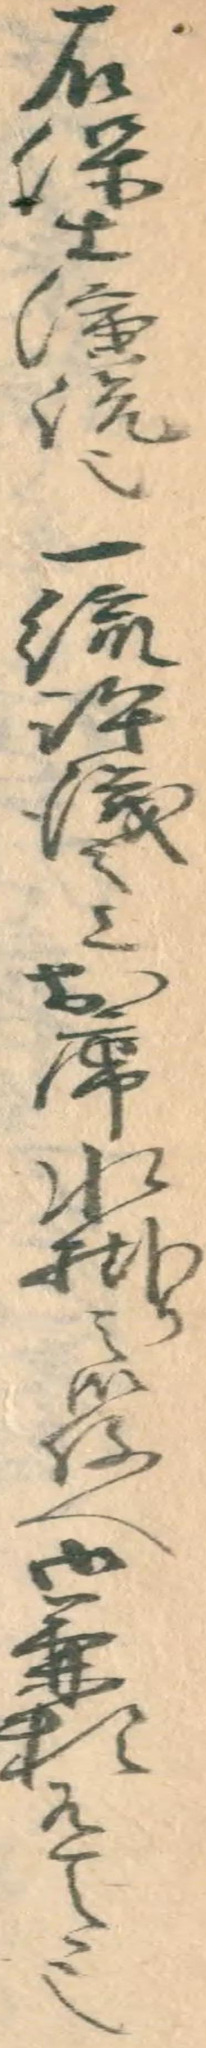右保土演説也一統評議之上於席水掛り之御役人御兼頼有之候也
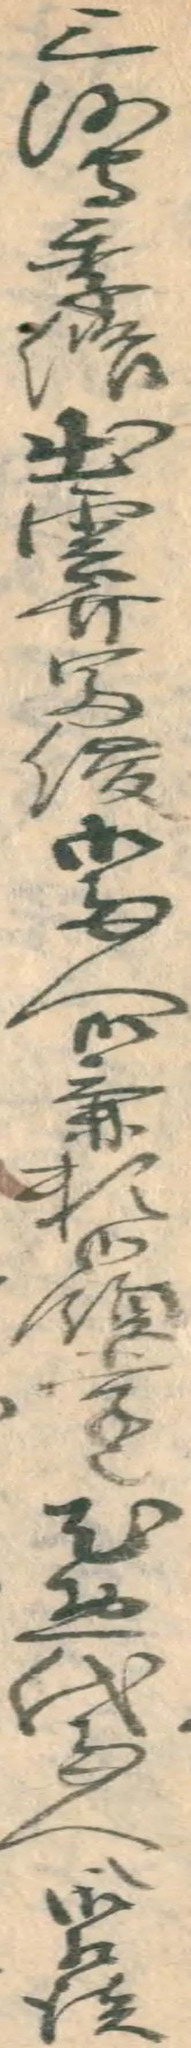三河守季脩出雲介冨俊御両人御兼頼御領掌也尤惣代両人も御相談
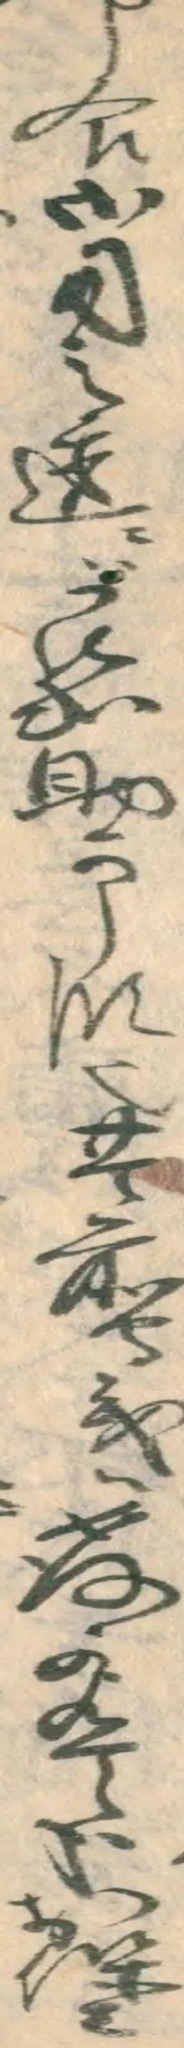申合御用之透ニハ罷出助可申段也豊前守義ハ如何可有之哉於保土ハ
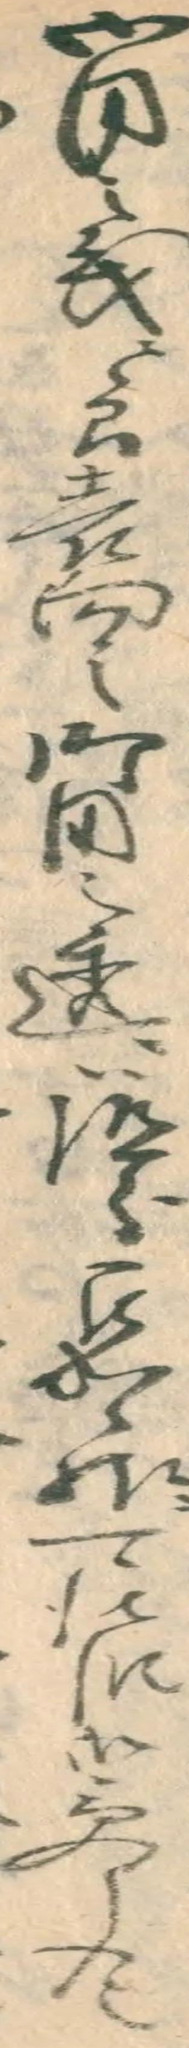御用之義ニ候間表向之御用之透ニハ随分罷出候様ニ可仕段御受申入也
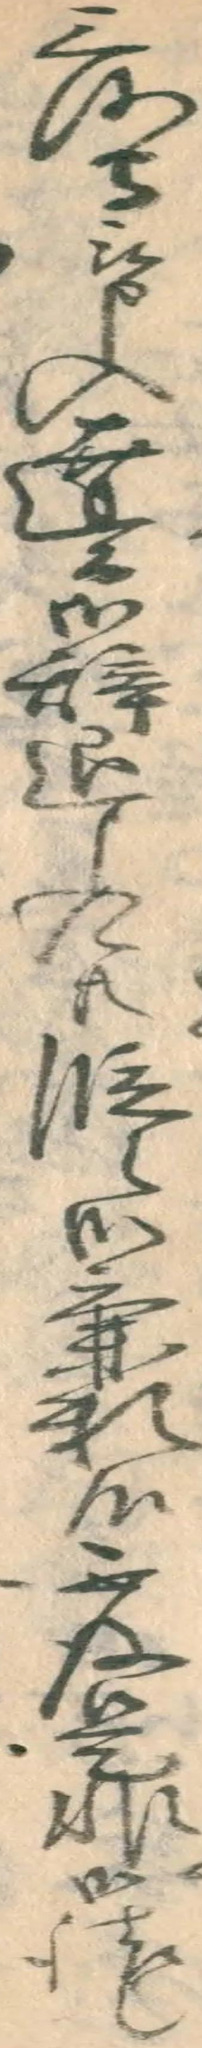三河守被申入達而御辞退申入候共段々御兼頼故不及是非御請申候
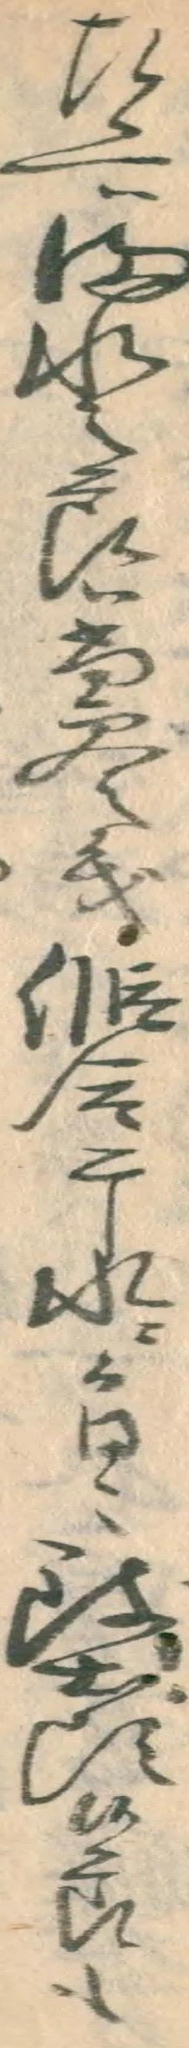左候へハ満水之節ハ尚更之義仮令干水ニ而日々致出頭候節も
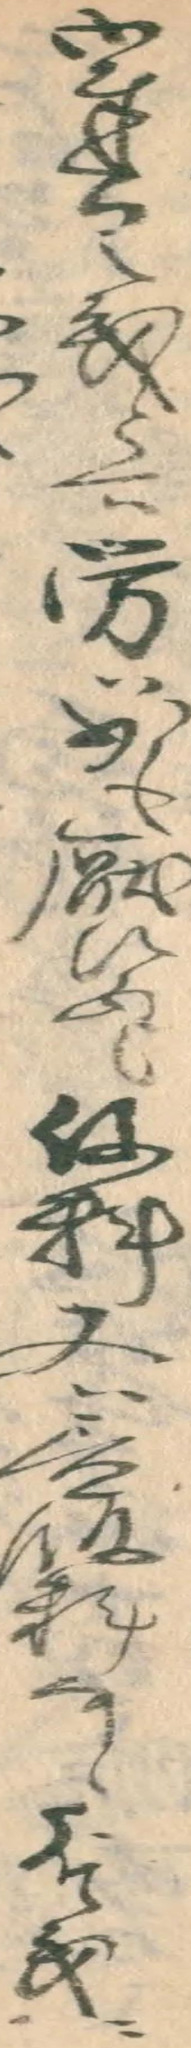御奉公之義候ヘハ労ハ少も厭ひ不申候役料又ハ昼飯料なと被下候義ニ
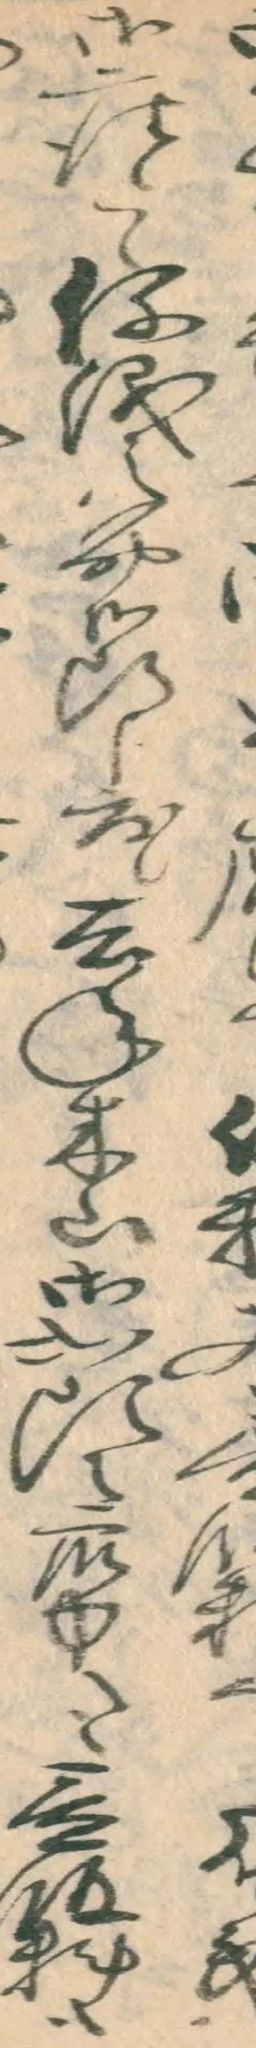御座候ハヽ役儀之筋御断申度候去年木山御出頭之衆中へも昼飯料も
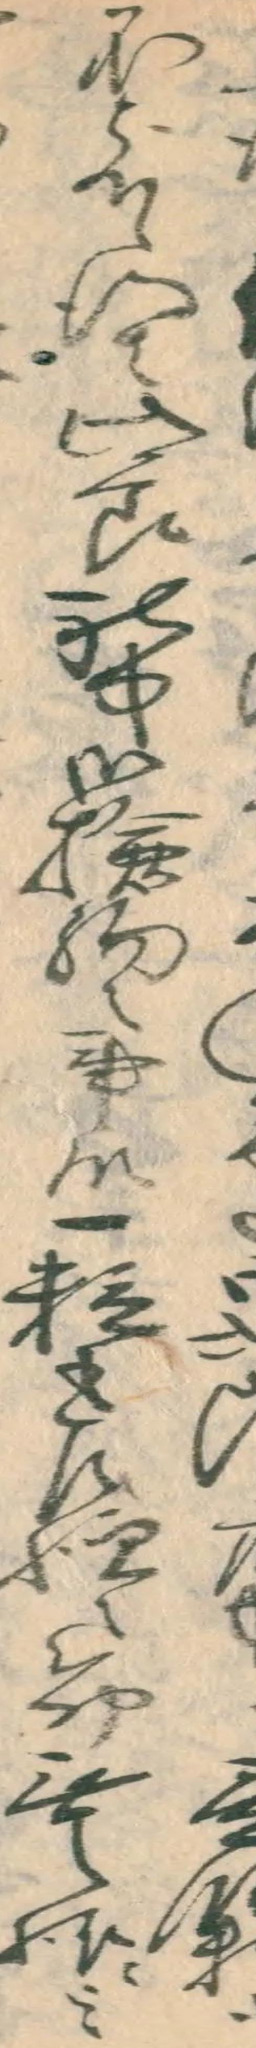不被下候得者此節社中御倹約之事故一粒も左様之筋無之様ニ候ハヽ
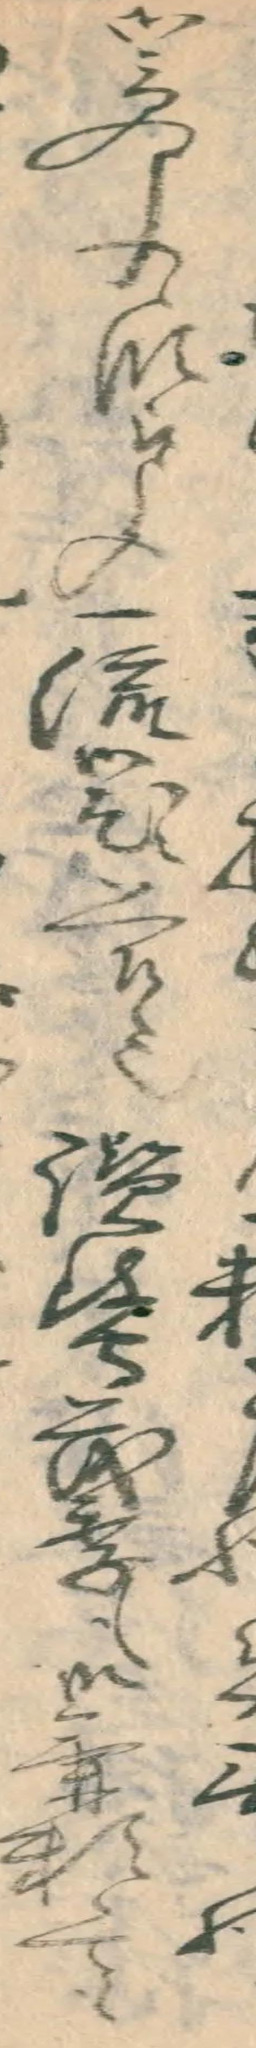御受申入候段被申入一統御尤ニ思召候也讃岐守茂季も御兼頼候ても
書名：賀茂社記録. 第58冊
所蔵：国立国会図書館 National Diet Library, JAPAN
